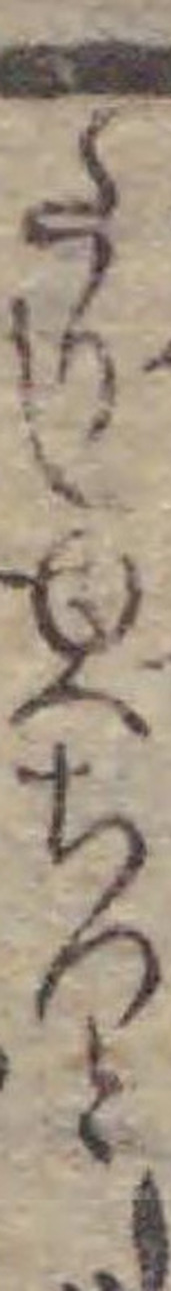たりしゆへちつと
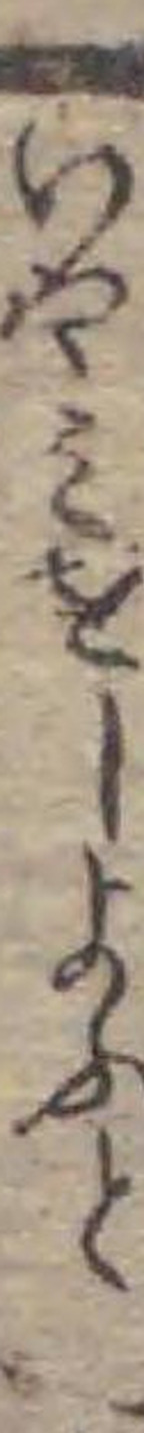いやみをしよふと
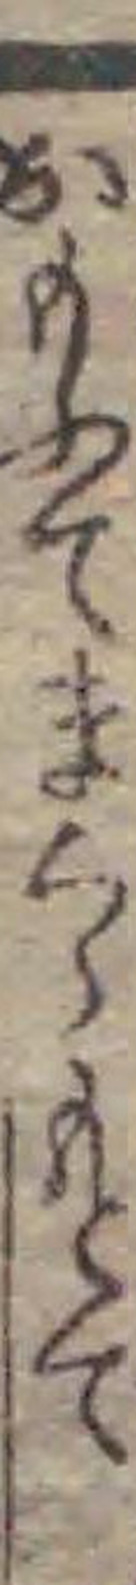おもふてまくらもとで
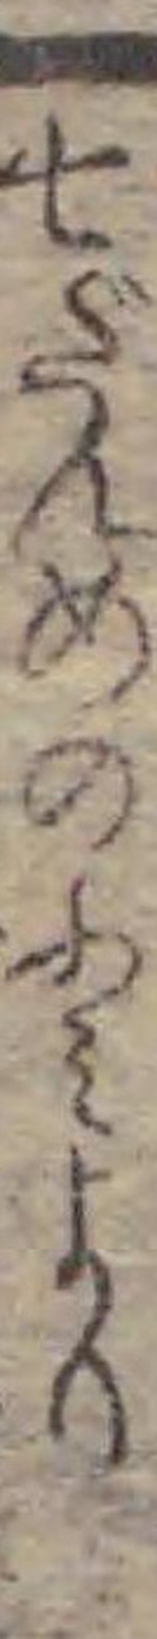七だんめのふみより
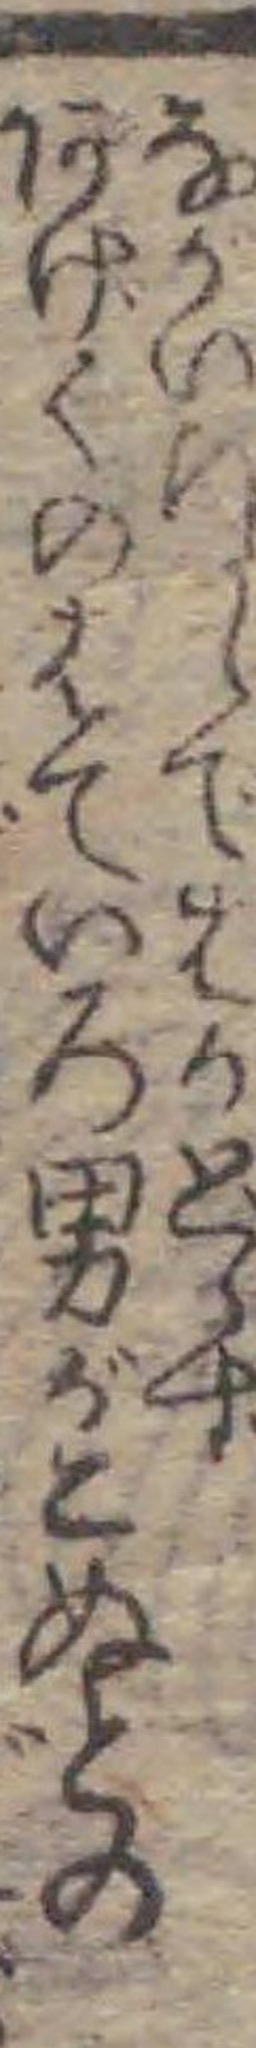あげくのはていろ男がこぬとの
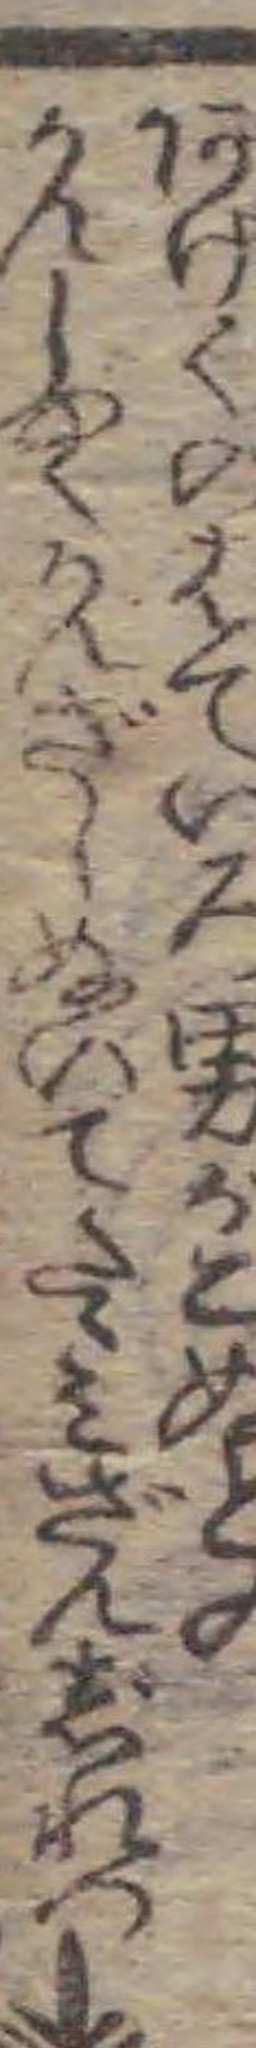かんしやくかんざしぬいてたゝみざんじれつ
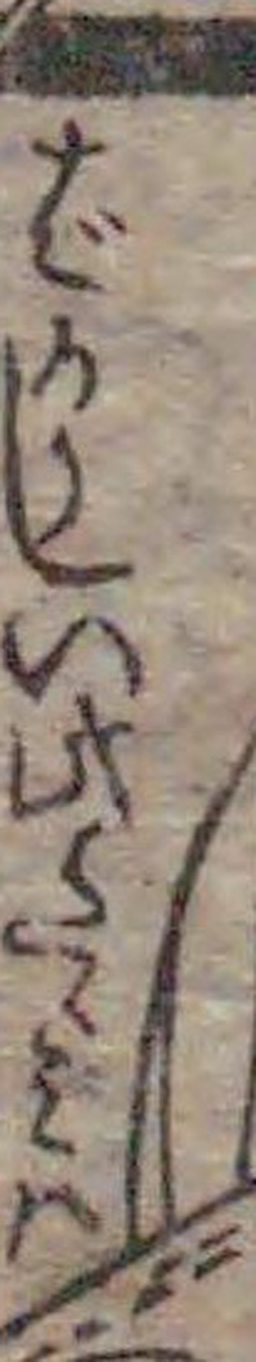ばからしい此たゝみは
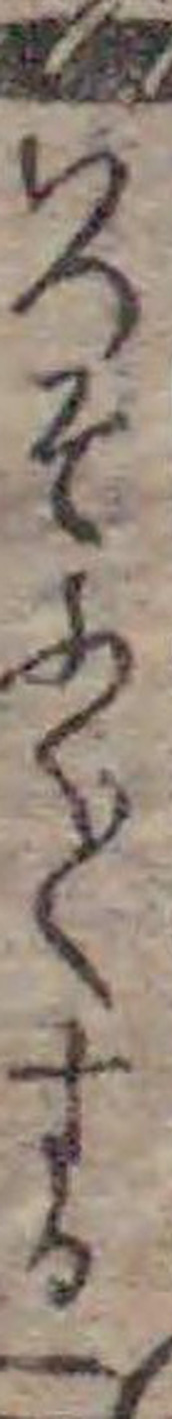いつそふく〳〵する
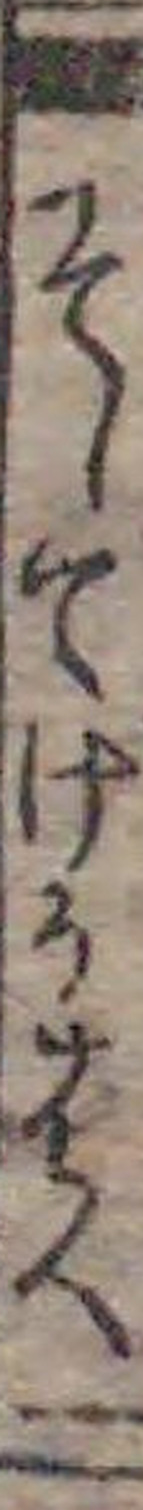そしてけかはへ
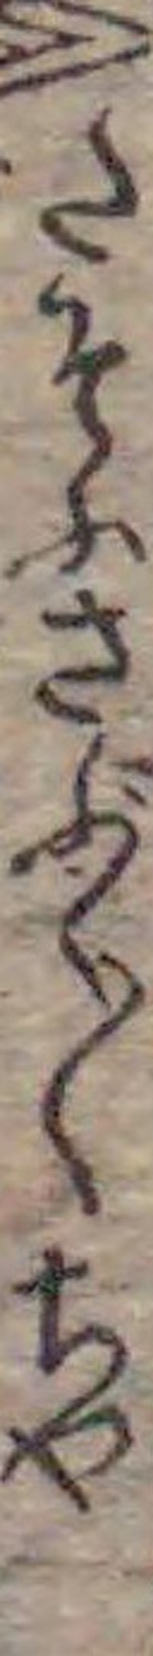たそふだぶく〳〵ちや
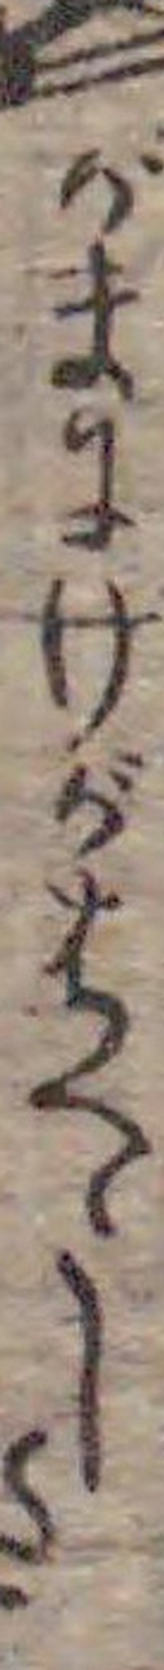がまにけがはへたした

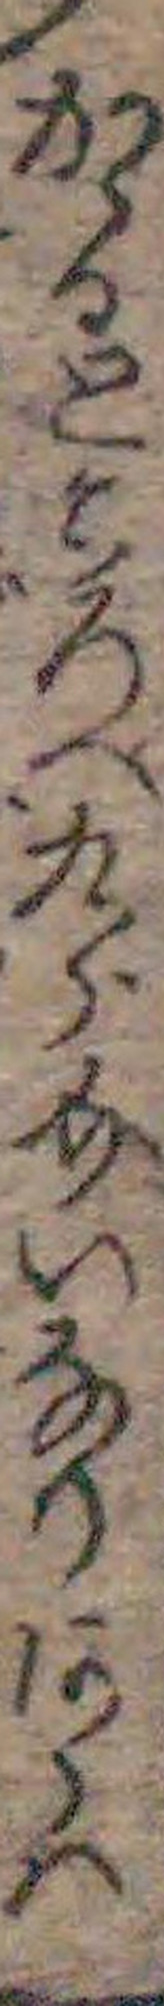かかるところへ九郎介いなりあらは
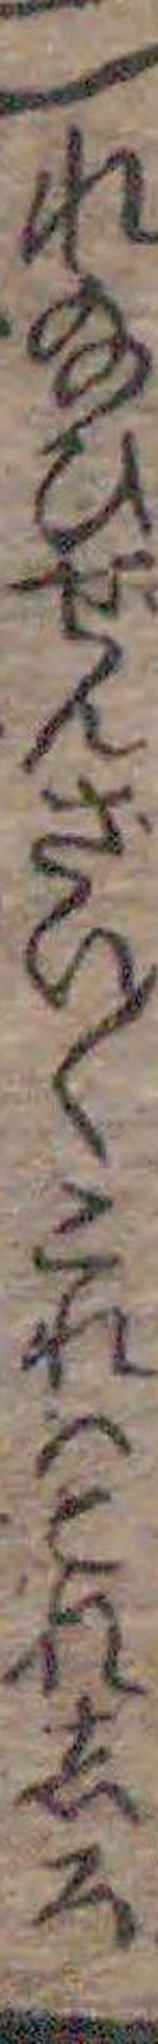れ給ひぜんざい〳〵これはこれしろ
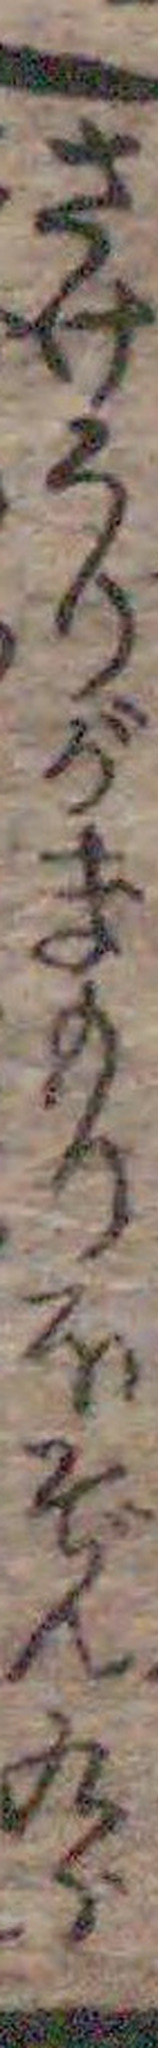さけうりがまもりほぞん九郎
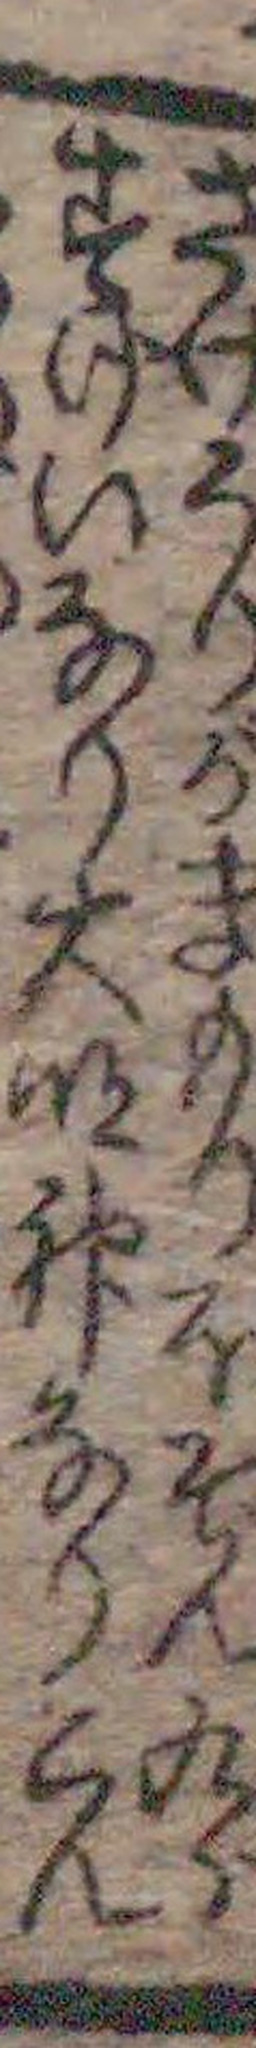すけいなり大明神なりこん
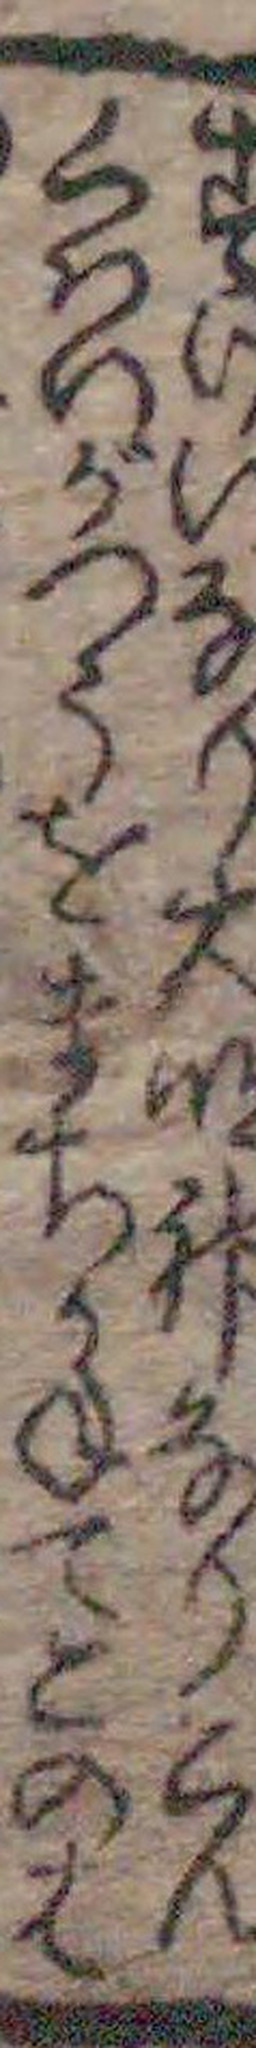くはいがつうをまちかねてこのは
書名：化物楽屋異牒 : 2巻
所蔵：国立国会図書館 National Diet Library, JAPAN
